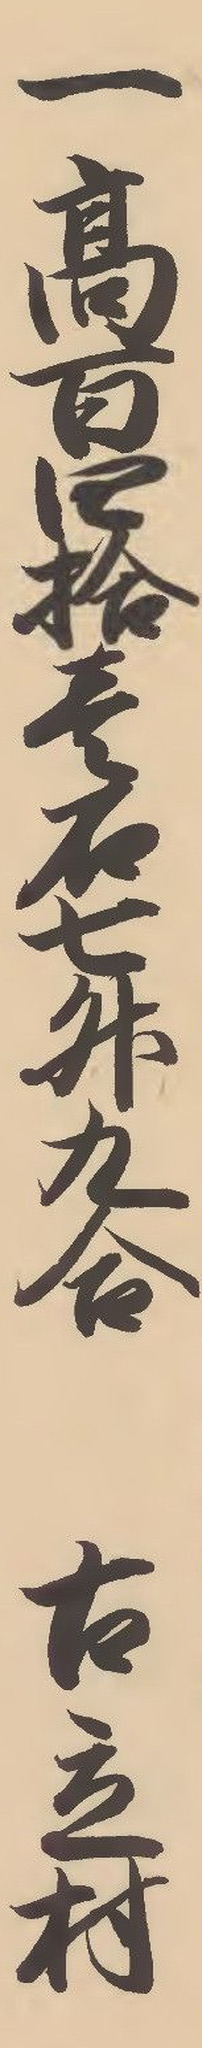一高百四拾壱石七升九合古立村
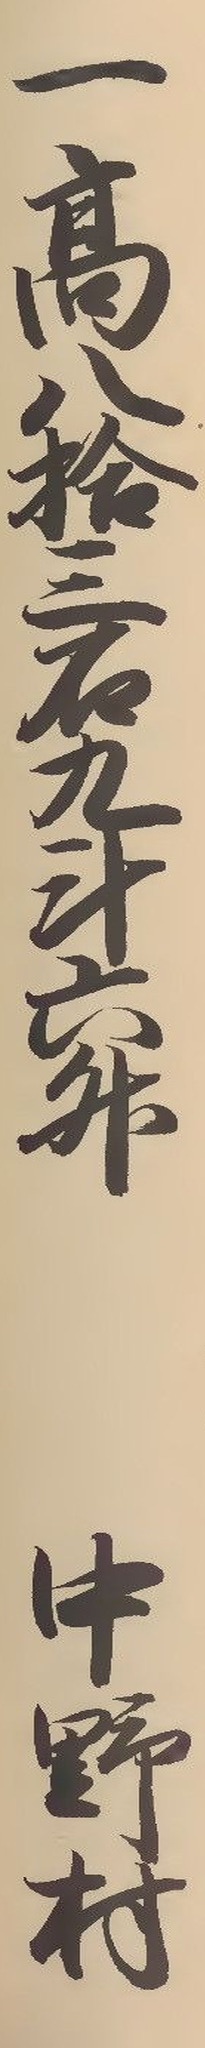一高八拾三石九斗六升中野村
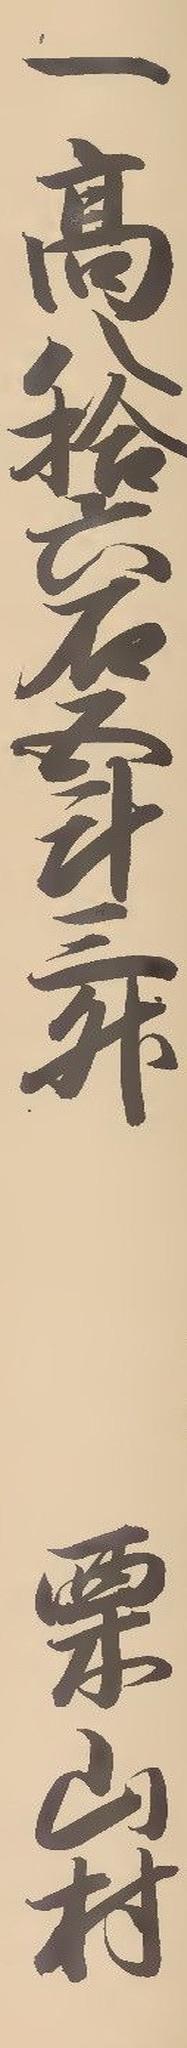一高八拾六石五斗三升栗山村
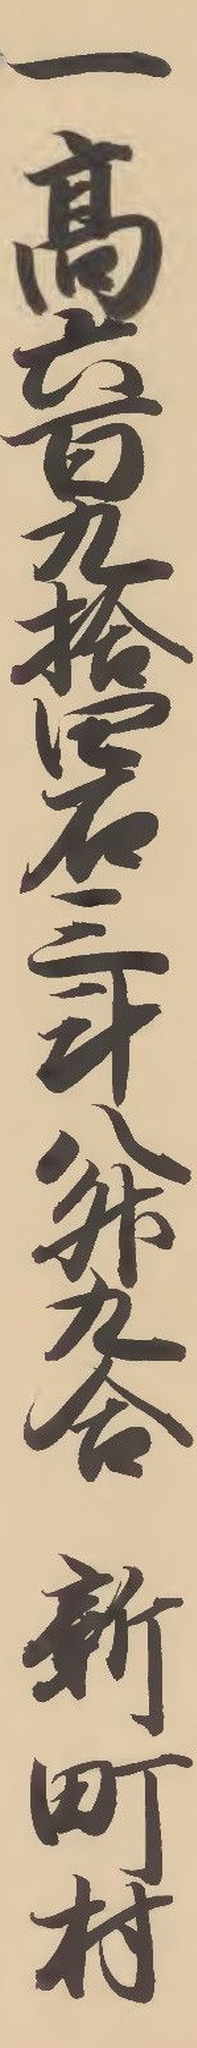一高六百九拾四石三斗八升九合新町村
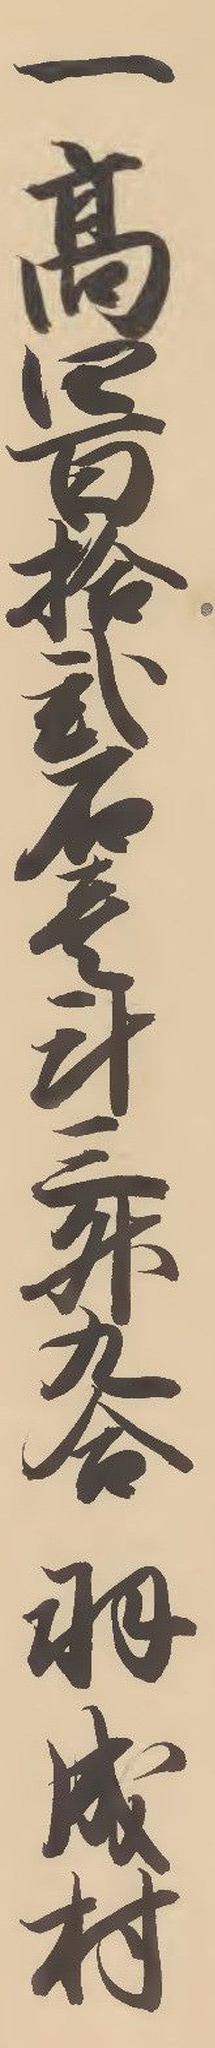一高四百拾弐石壱斗三升九合羽成村
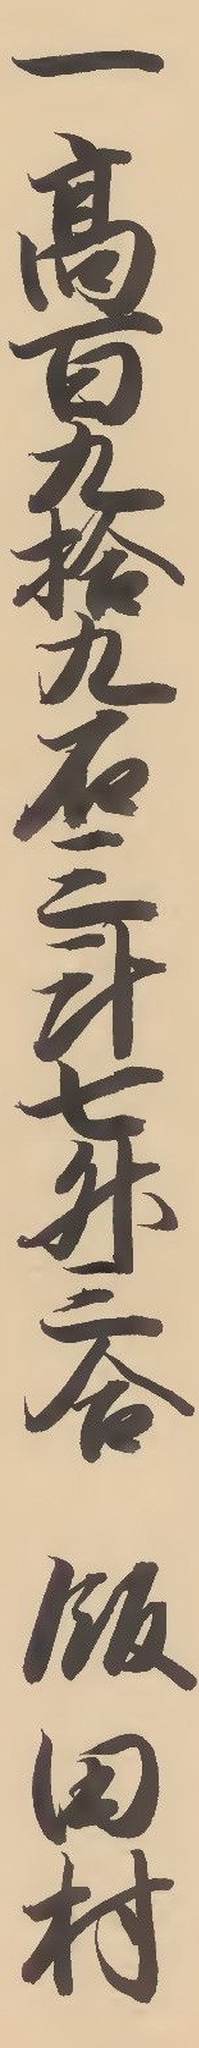一高百九拾九石三斗七升三合飯田村

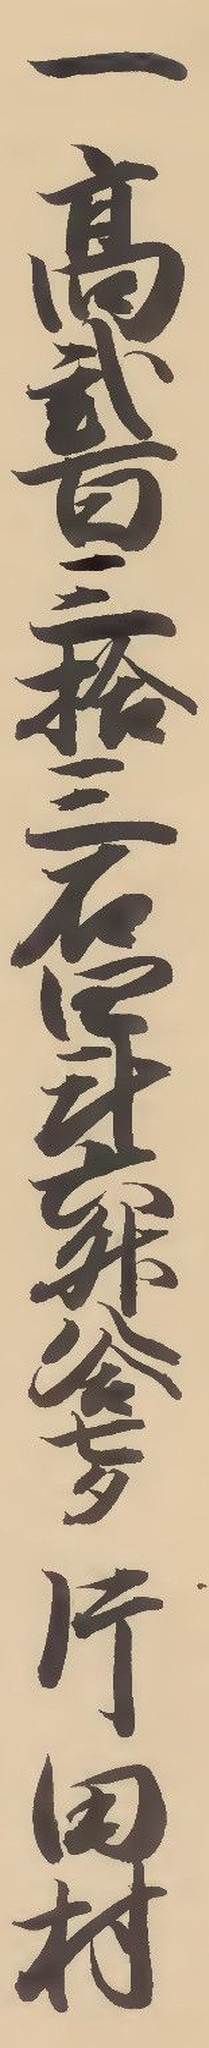一高弐百三拾三石四斗六升八合七勺片田村
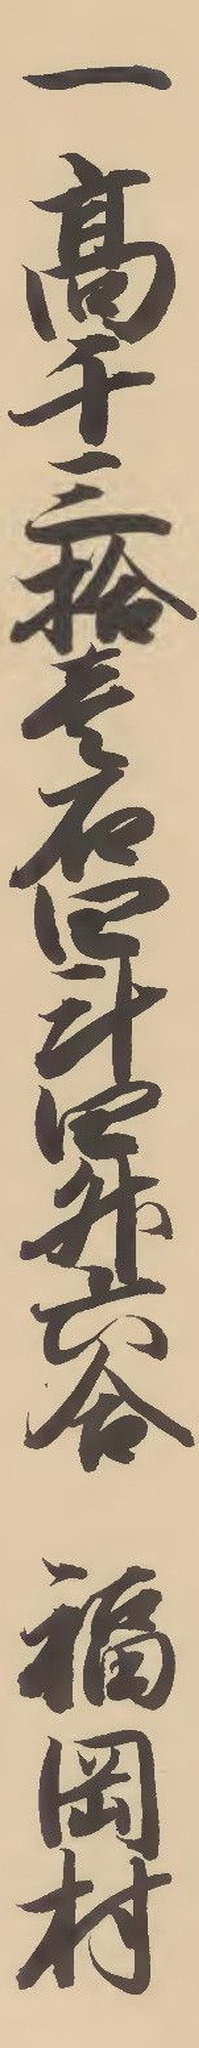一高千三拾壱石四斗四升六合福岡村
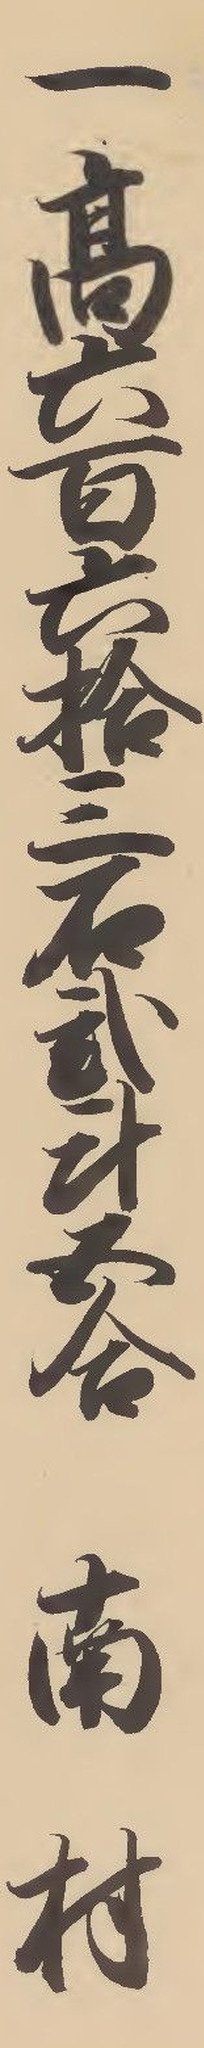一高六百六拾三石弐斗五合南村
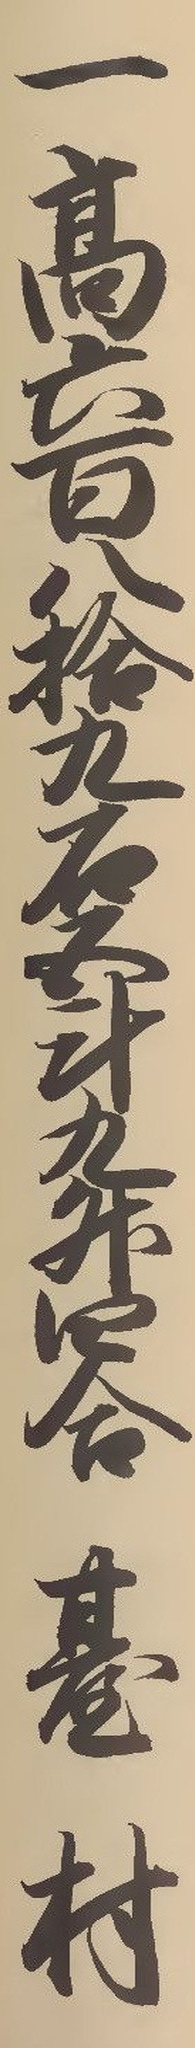一高六百八拾九石五斗九升四合台村
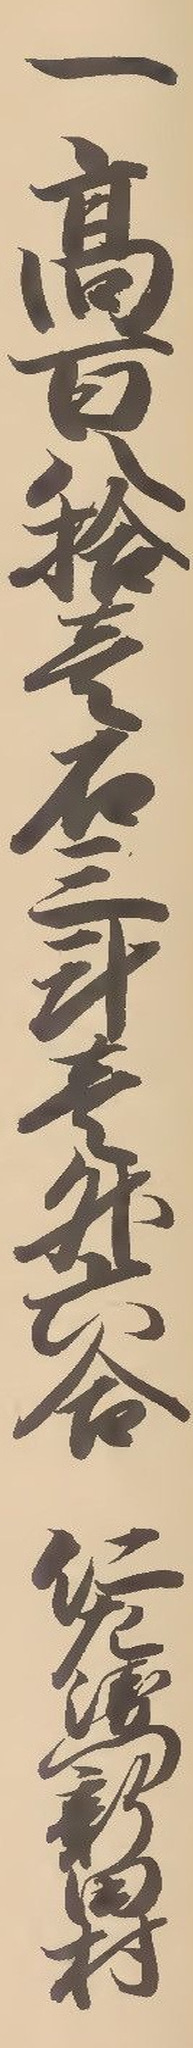一高百八拾壱石三斗壱升六合仁左衛門新田村
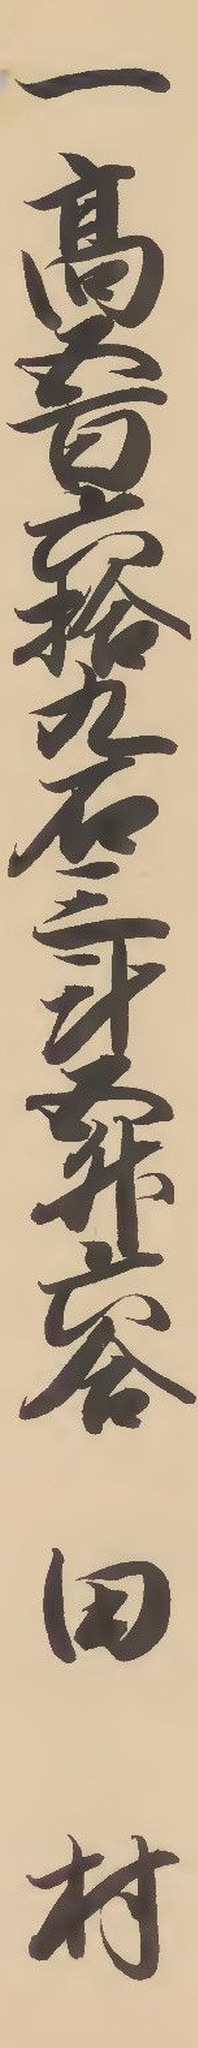一高五百六拾九石三斗五升六合田村
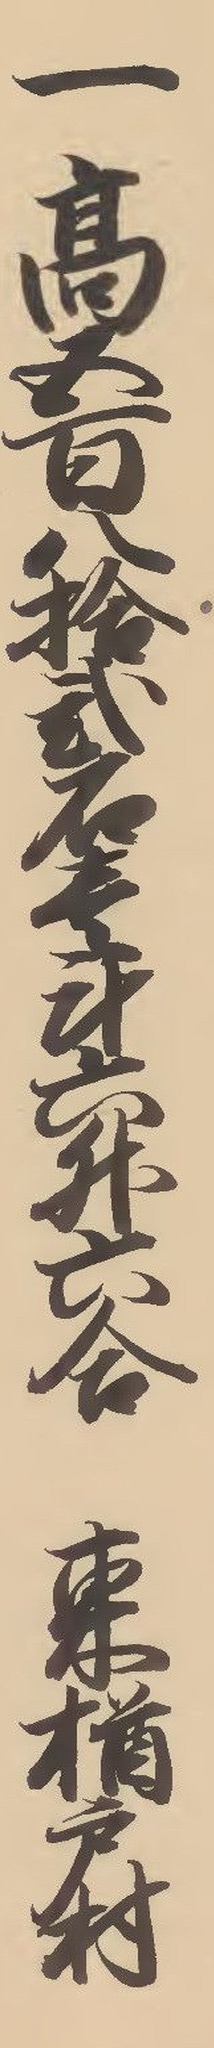一高五百八拾弐石壱斗六升六合東楢戸村
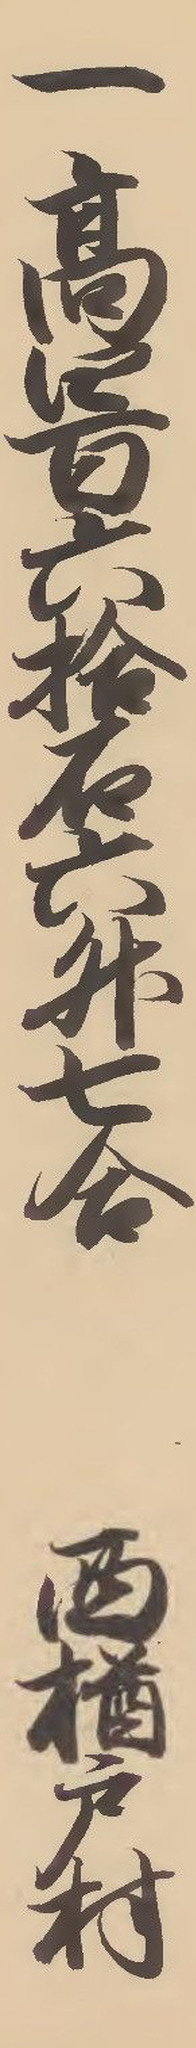一高四百六拾石六升七合西楢戸村

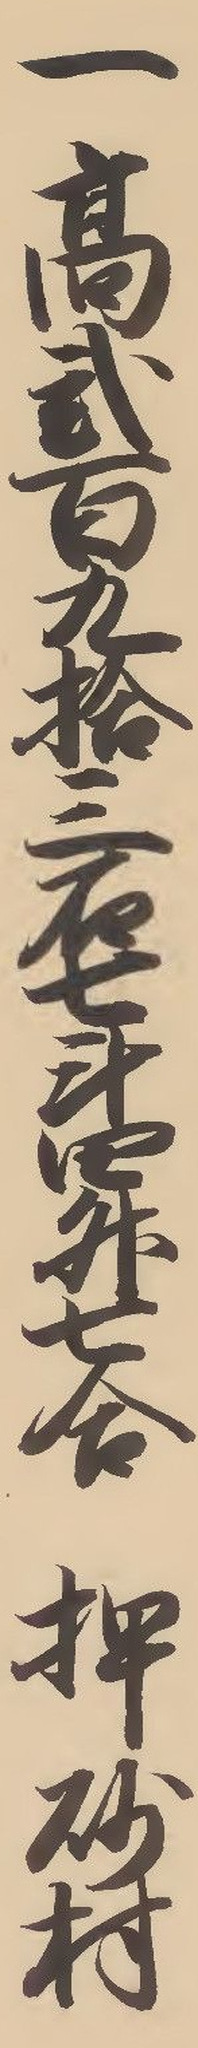一高弐百九拾三石七斗四升七合押砂村
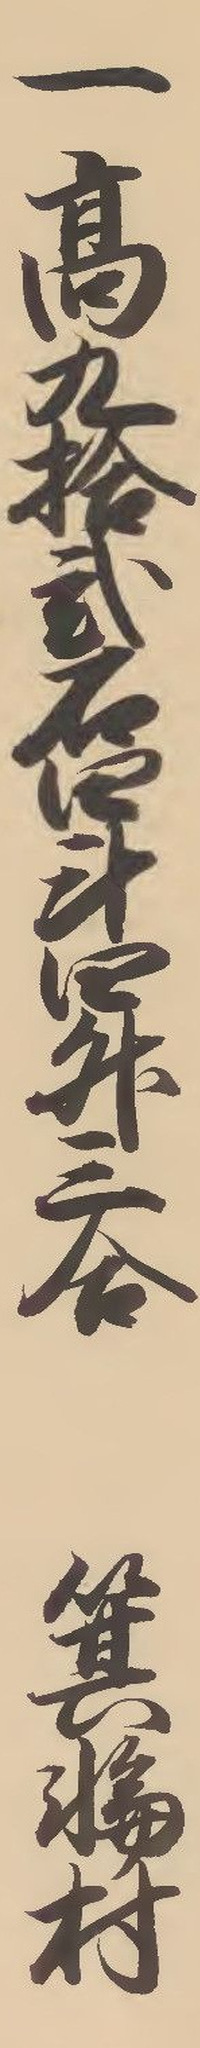一高九拾弐石四斗四升三合箕輪村
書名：常陸国郷帳
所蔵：国立公文書館 National Archives of Japan
